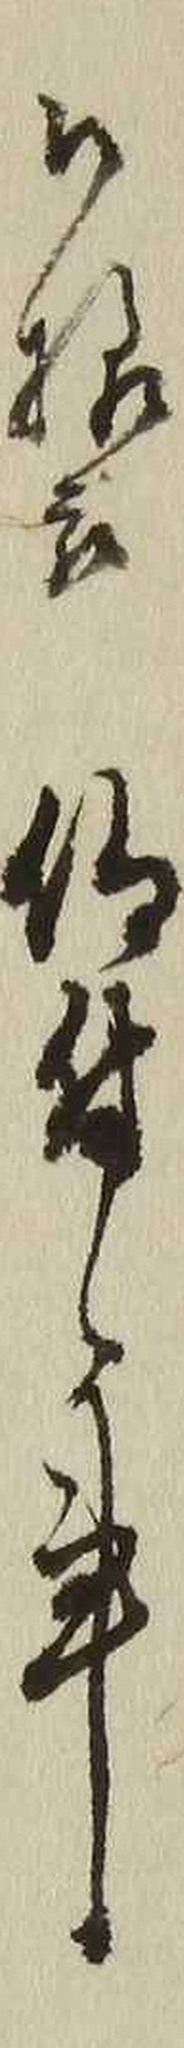候様被仰付候事
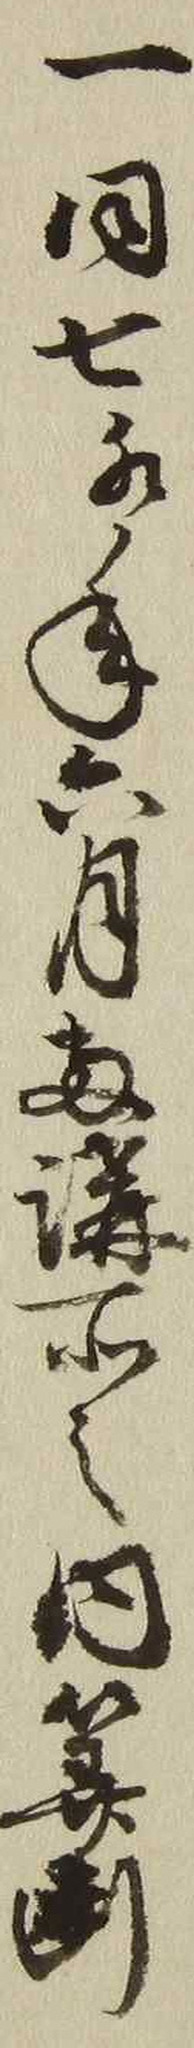一同七卯年六月両講所之内算断
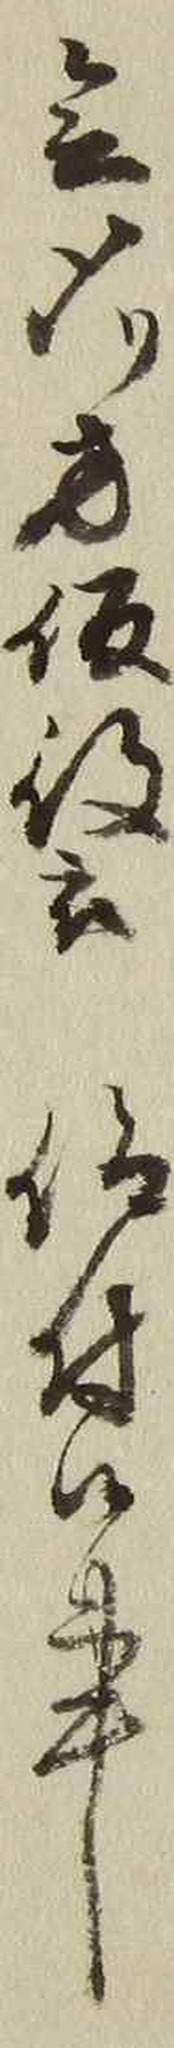之〆り方仮役被仰付候事
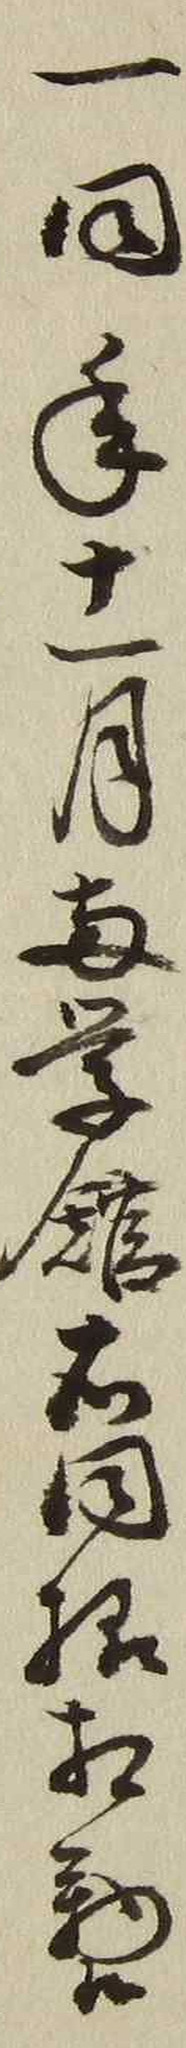一同年十一月両学館右同様相勤候
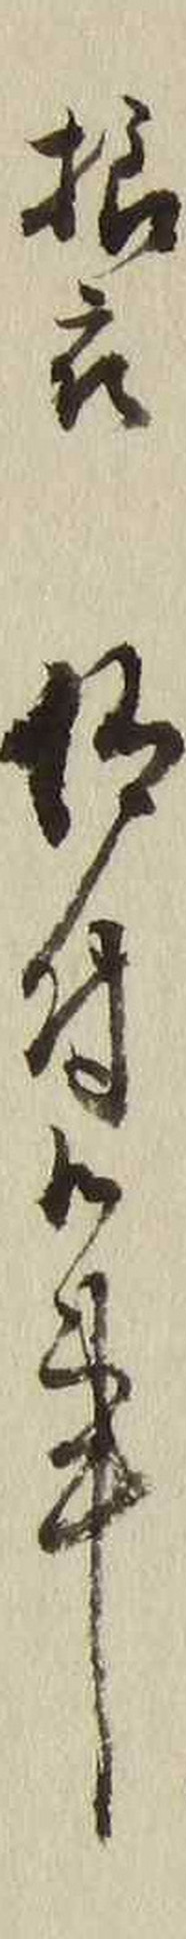様被仰付候事
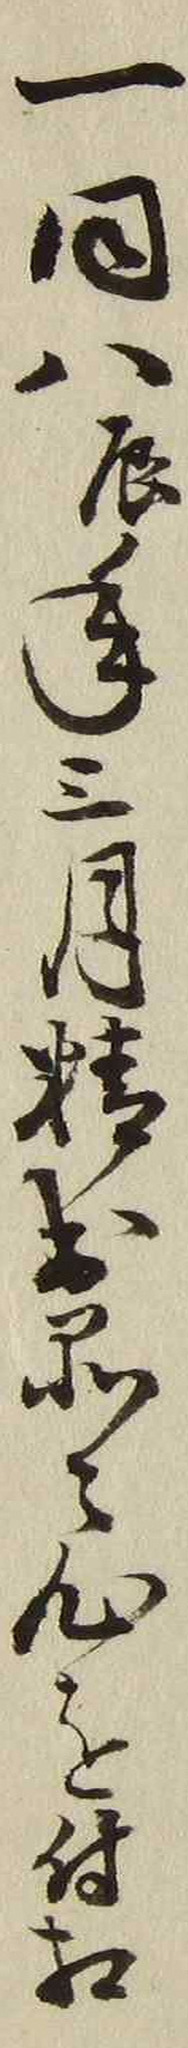一同八年辰年三月精出品々心を付相
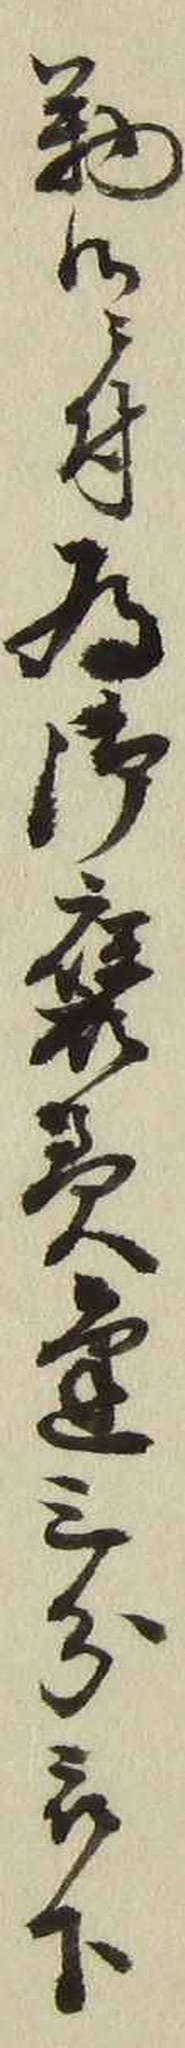勤候に付為御褒美金三分被下
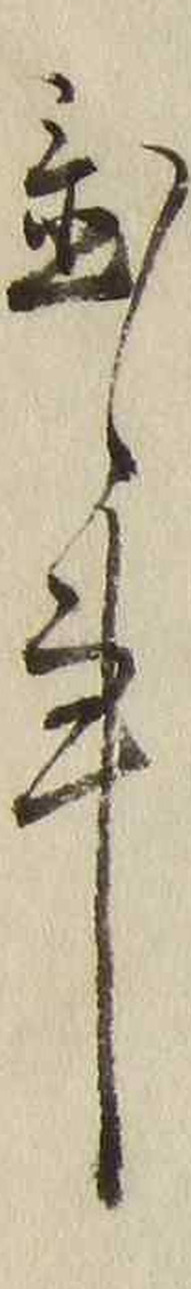置候事
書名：諸士系譜　巻之38　は之部6
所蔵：会津若松市立会津図書館
